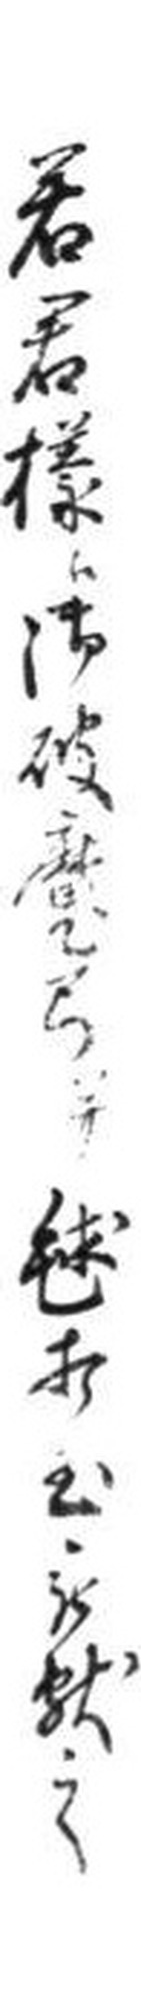若君様江御破魔弓并毬打玉被献之
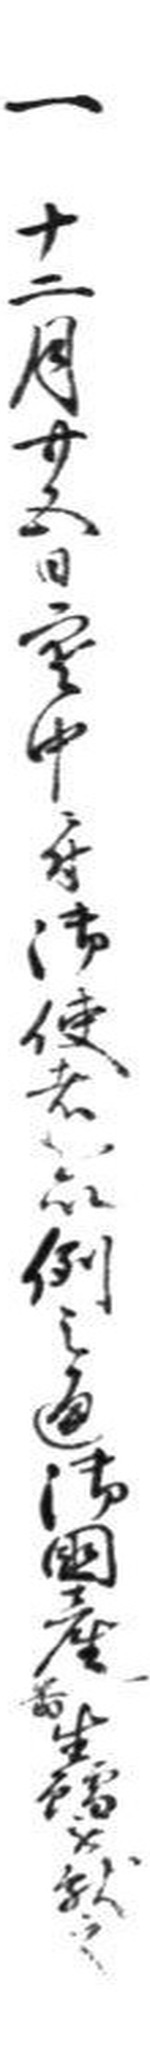一十二月廿五日寒中ニ付御使者を以例之通御国産一番生鱈被献之
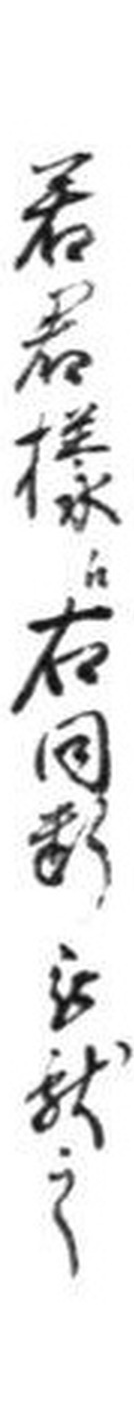若君様江右同断被献之
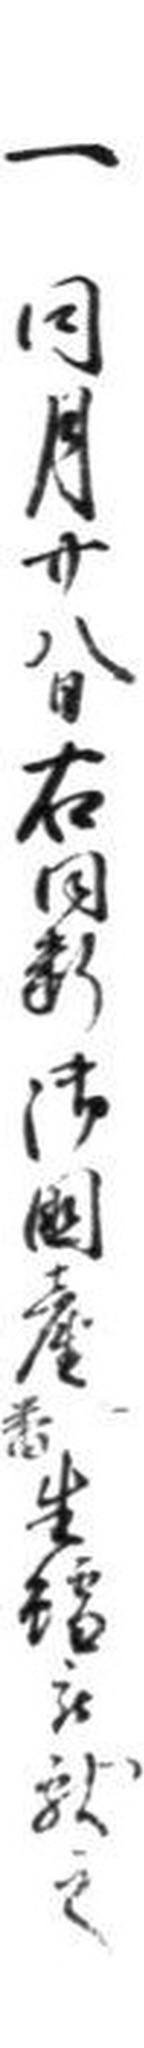一同月廿八日右同断御国産一番生鱈被献之
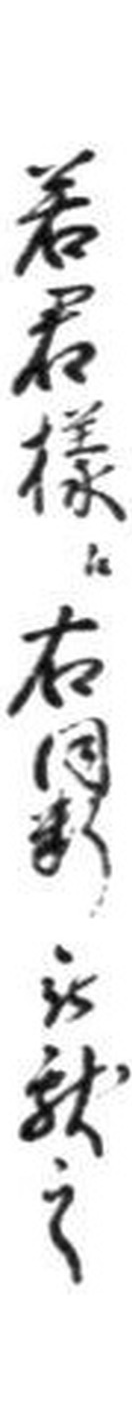若君様江右同断被献之
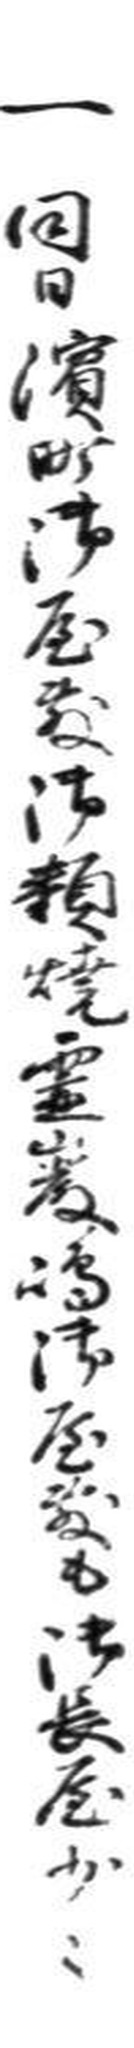一同日浜町御屋敷御類焼霊巌島御屋敷も御長屋少々
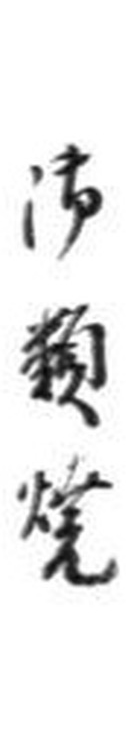御類焼
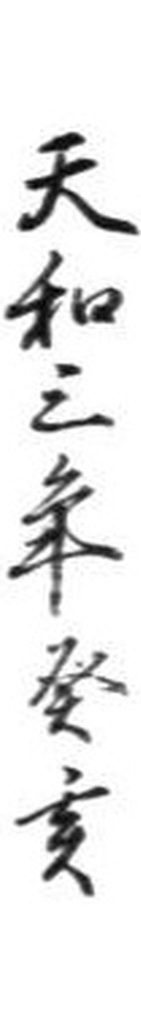天和三年癸亥
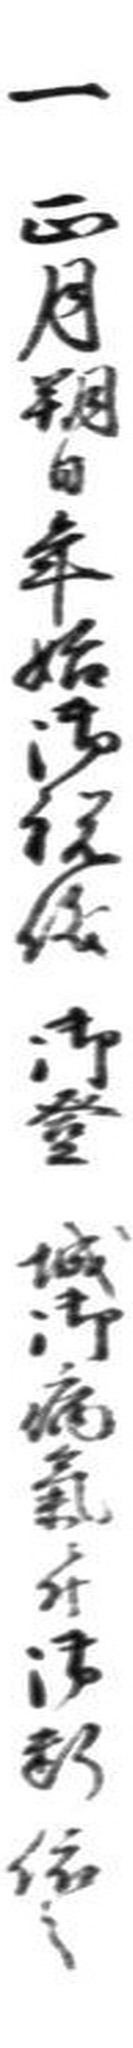一正月朔日年始御祝儀御登城御病気ニ付御断依之
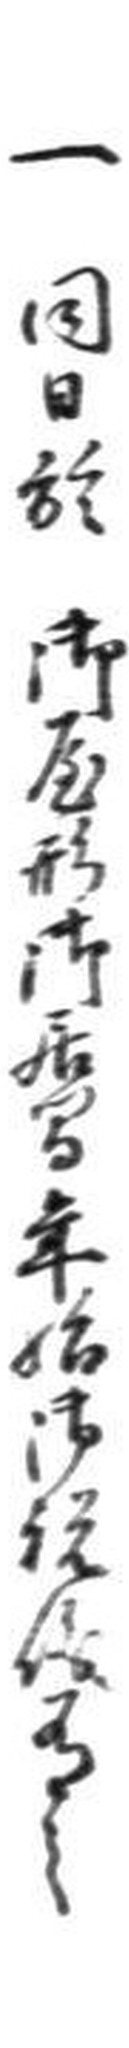一同日於御屋形御居間年始御祝儀有之
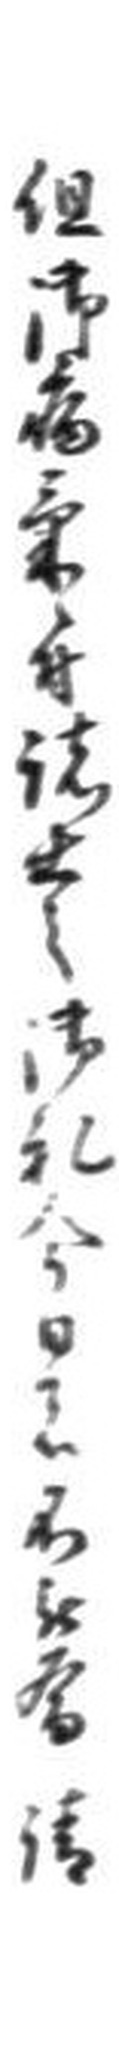但御病気ニ付諸士之御礼今日者不被為請
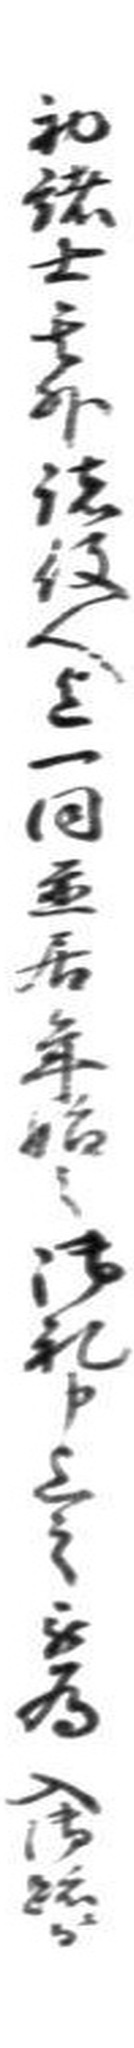初諸士其外諸役人迄一同並居年始之御礼申上之被為入御跡ニ而
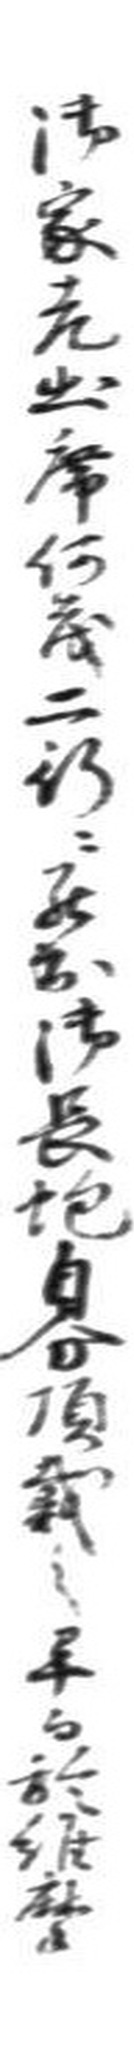御家老出席何も二行ニ罷出御長蚫自分頂戴之畢而於維摩

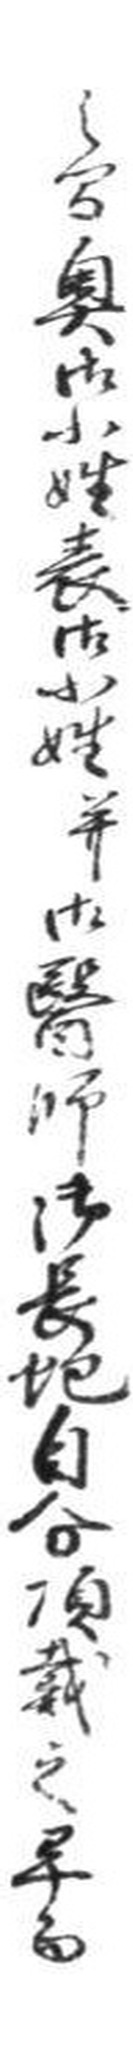之間奥御小姓表御小姓并御医師御長蚫自分頂戴之畢而
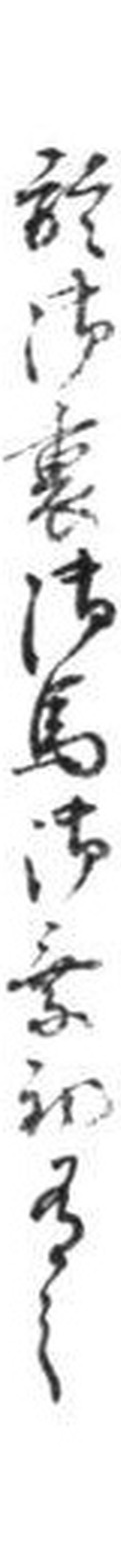於御裏御馬御乗初有之
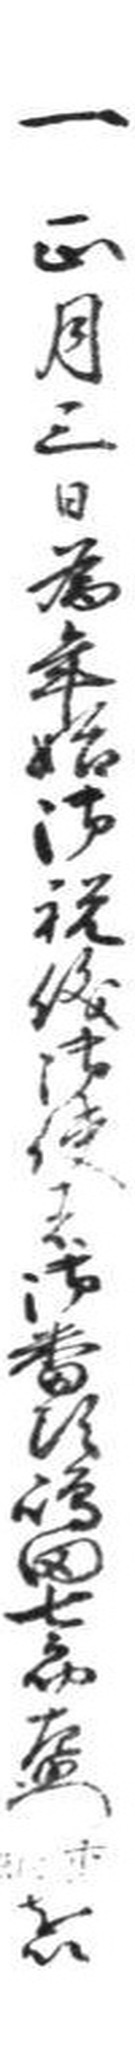一正月三日為年始御祝儀御使者御番頭嶋田七郎左衛門重矩を以
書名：家譜 十五 綱昌公 従天和元年到元禄十二年
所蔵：福井県文書館 Fukui Prefectural Archives
